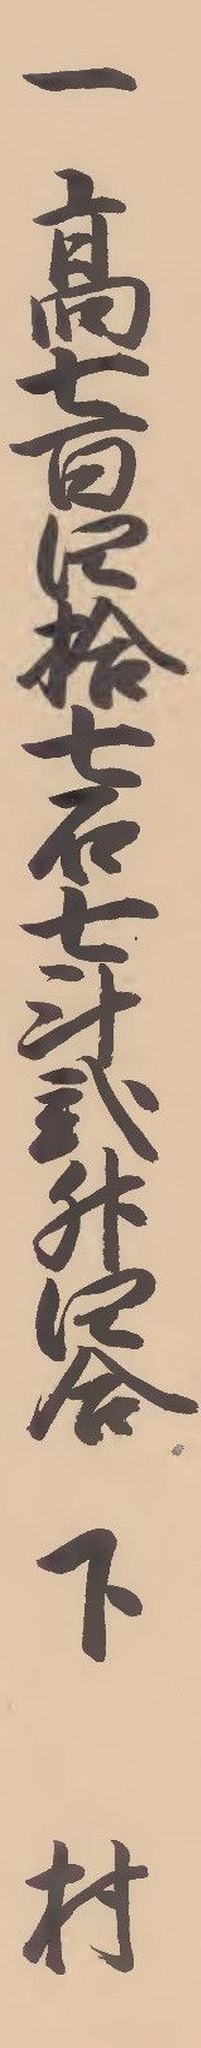一高七百四拾七石七斗弐升四合下村

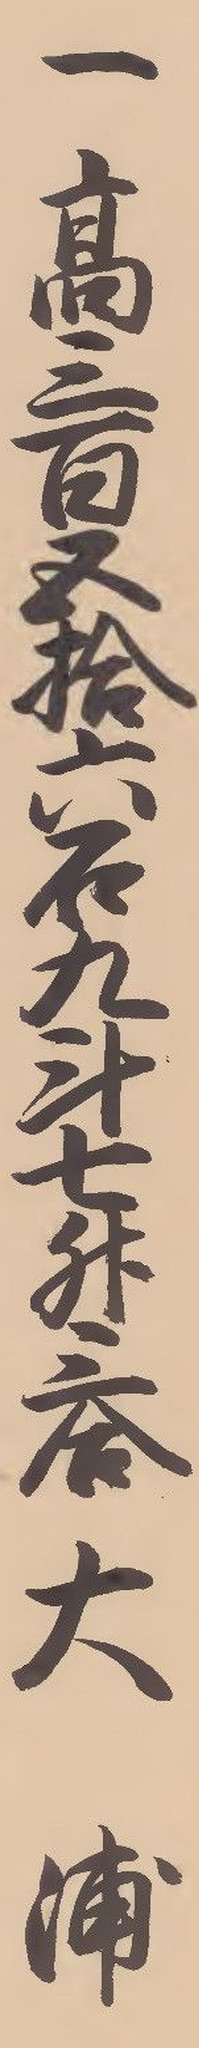一高三百五拾六石九斗七升三合大浦
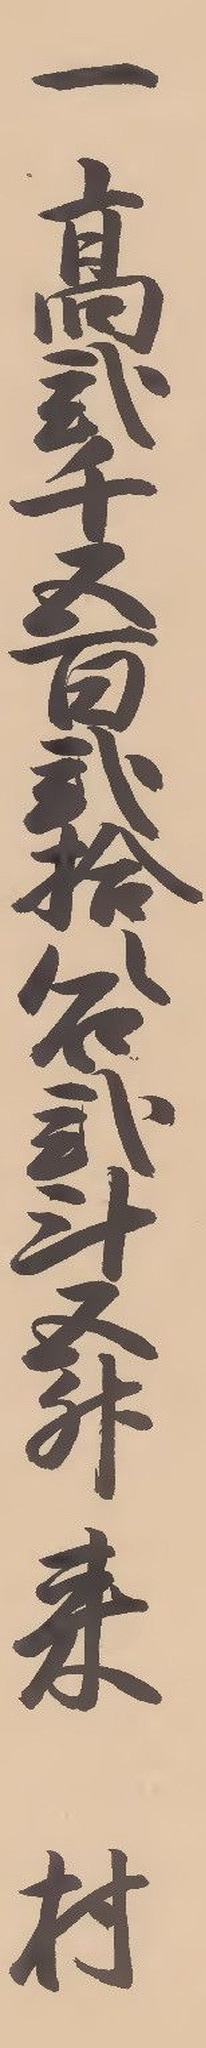一高弐千五百弐拾八石弐斗五升来村
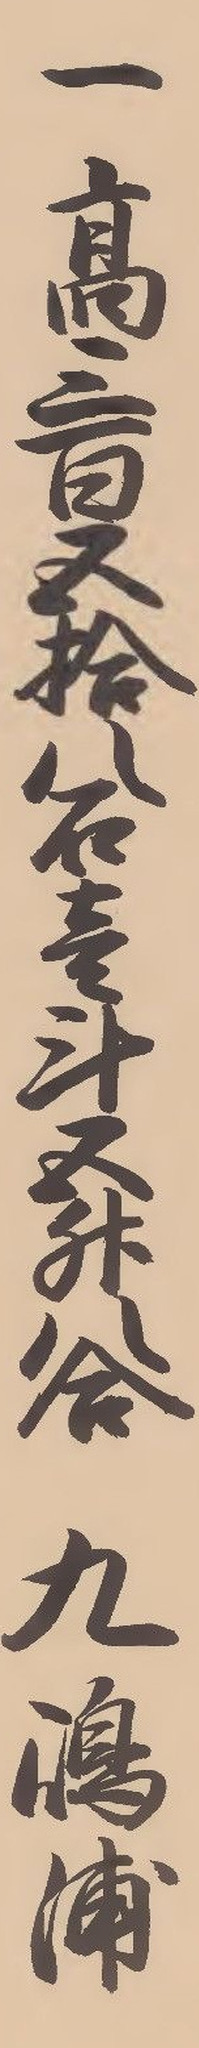一高三百五拾八石壱斗五升八合九島浦
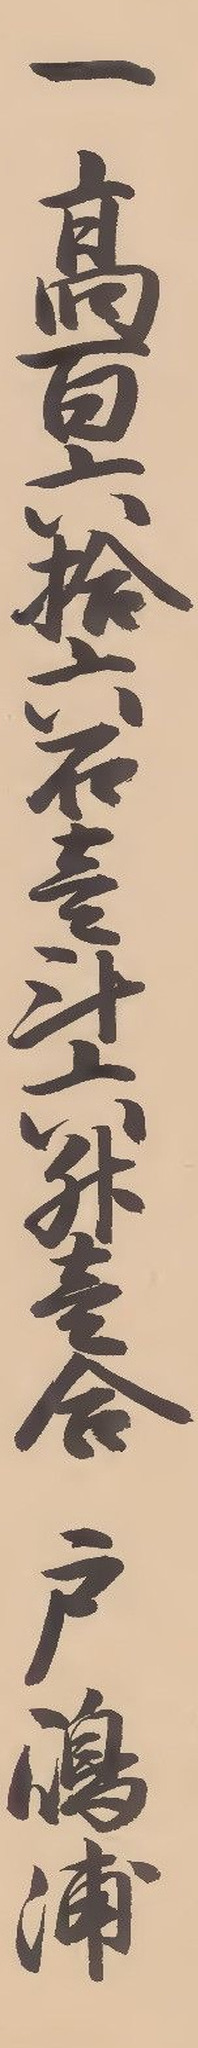一高百六拾六石壱斗六升壱合戸島浦
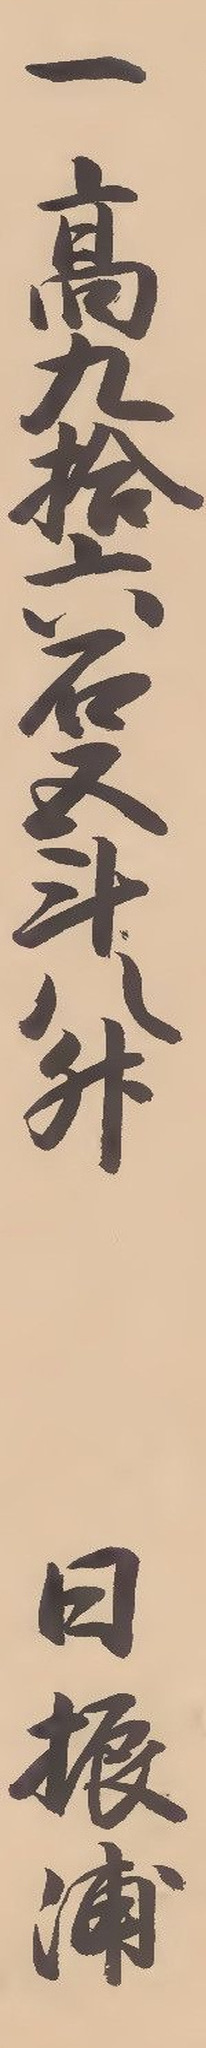一高九拾六石五斗八升日振浦
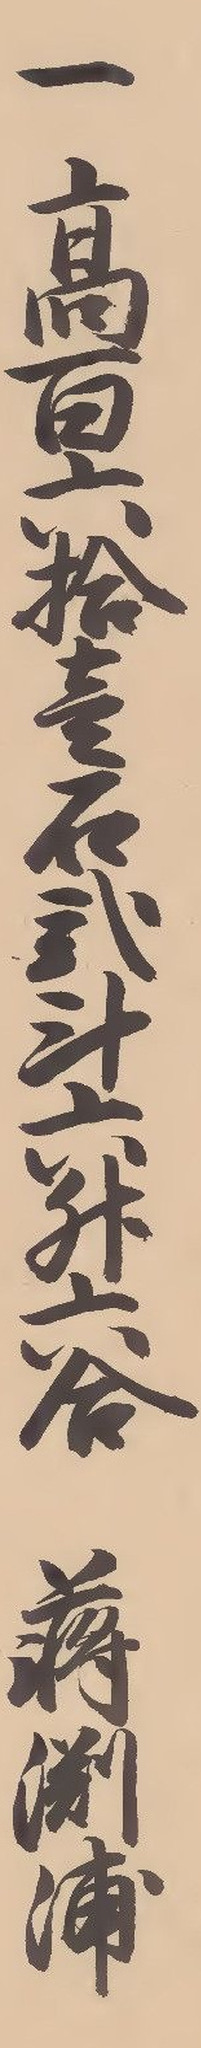一高百六拾壱石弐斗六升六合蒋渕浦
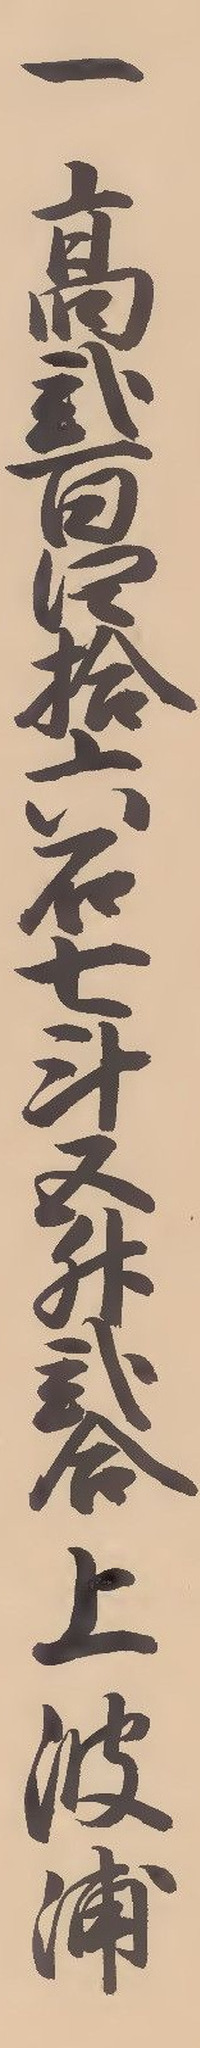一高弐百四拾六石七斗五升弐合上波浦
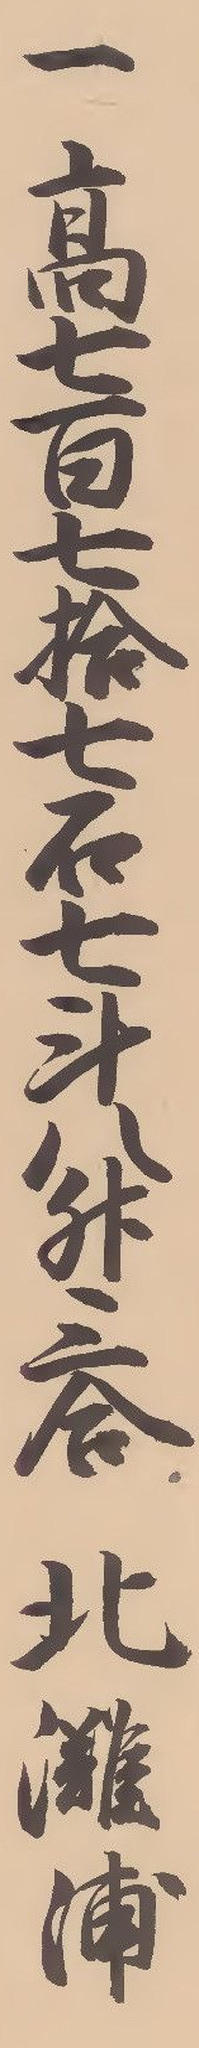一高七百七拾七石七斗八升三合北灘浦

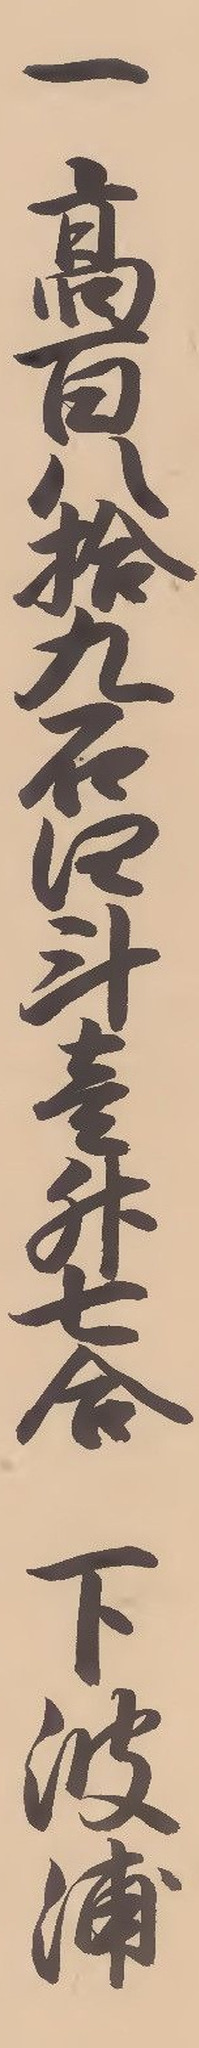一高百八拾九石四斗壱升七合下波浦
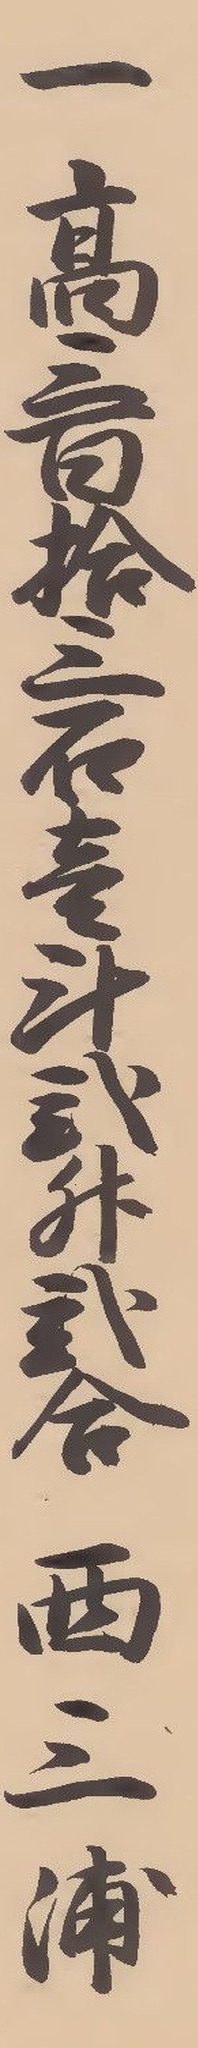一高三百拾三石壱斗弐升弐合西三浦
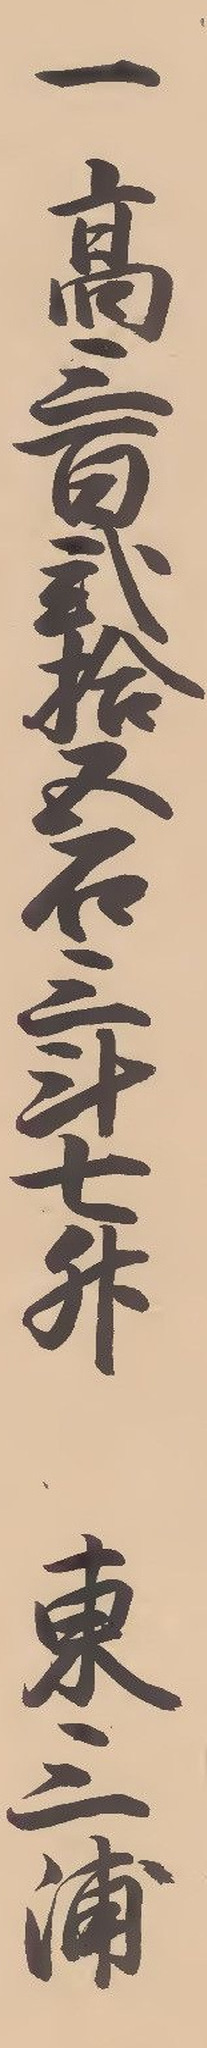一高三百弐拾五石三斗七升東三浦
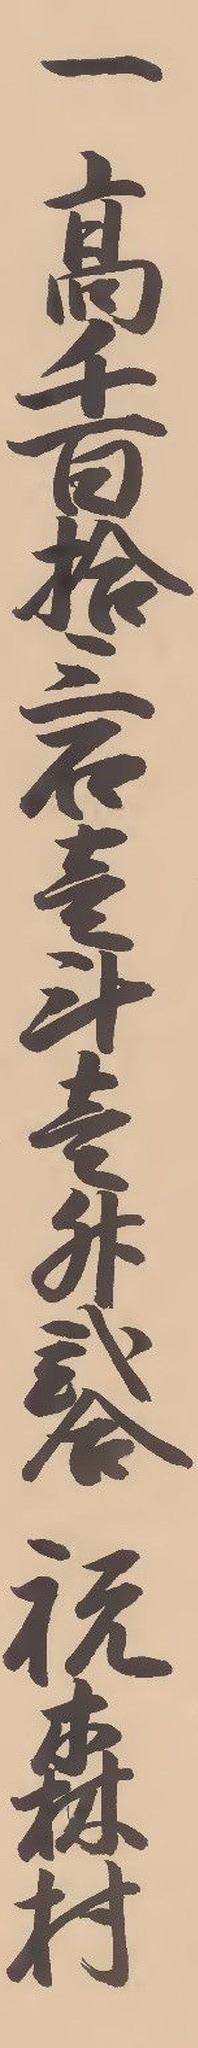一高千百拾三石壱斗壱升弐合祝森村
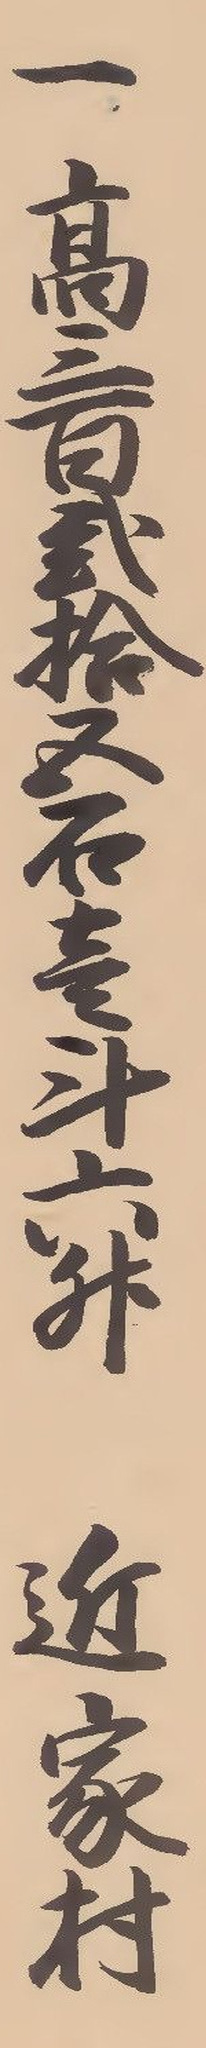一高三百弐拾五石壱斗六升近家村
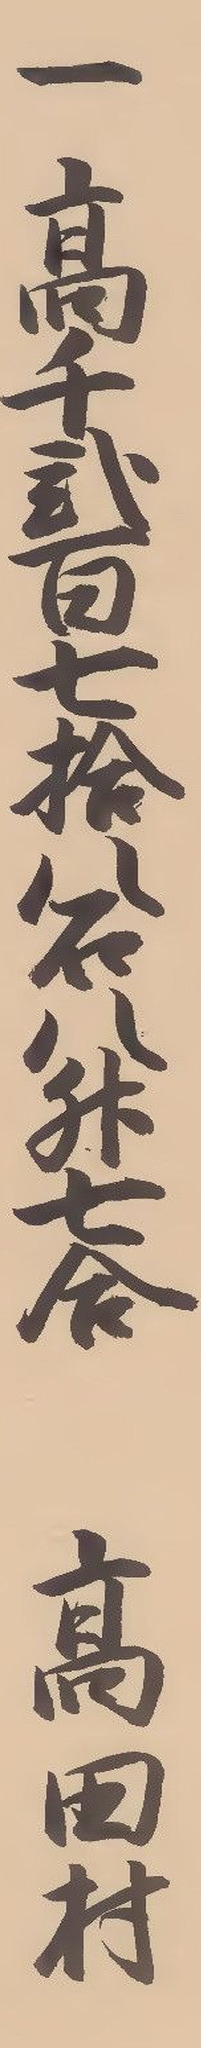一高千弐百七拾八石八升七合高田村
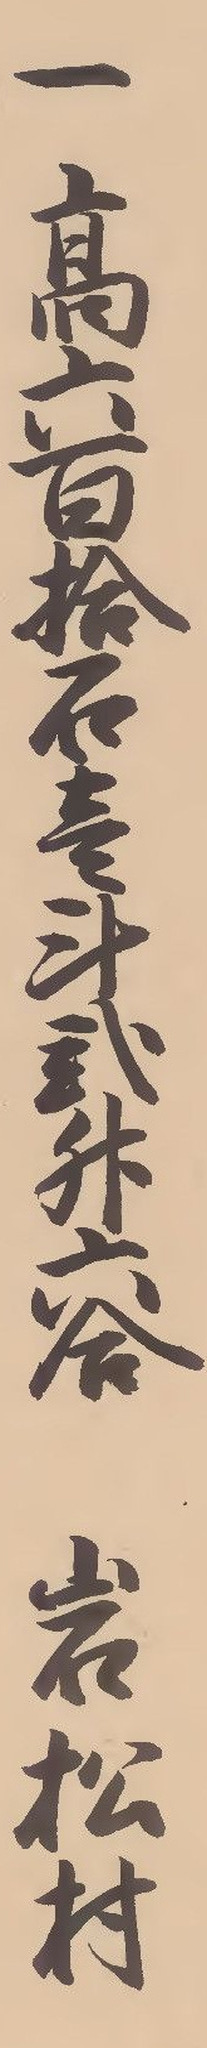一高六百拾石壱斗弐升六合岩松村
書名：伊予国郷帳
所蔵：国立公文書館 National Archives of Japan
